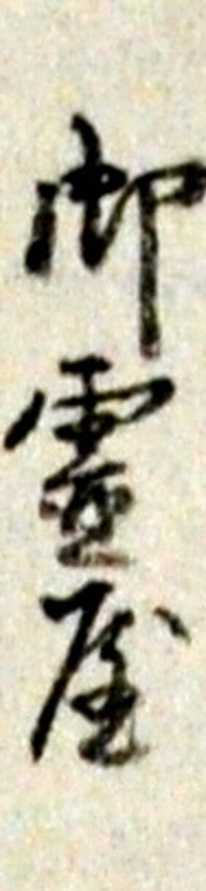御霊屋
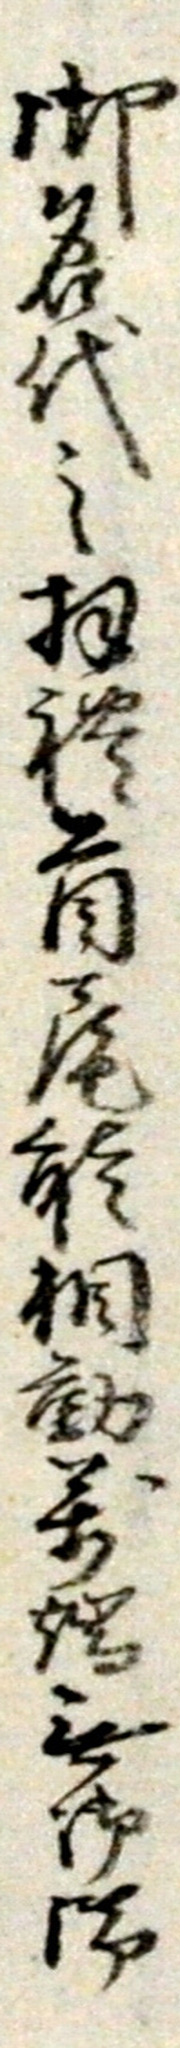御名代拝禮首尾能相勤万端無御滞
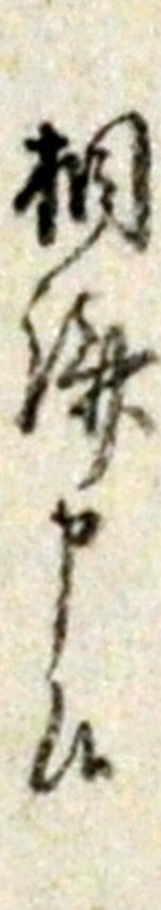相済申候
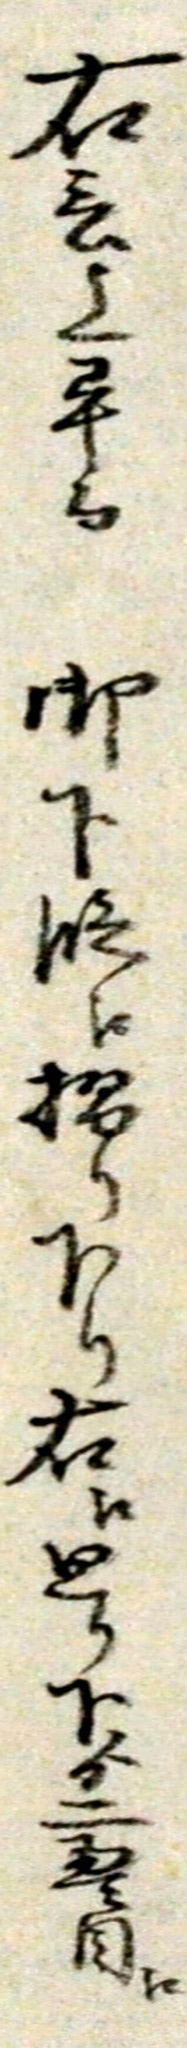右言上畢而御下段江摺り下り右江廻り下ゟ二畳目江
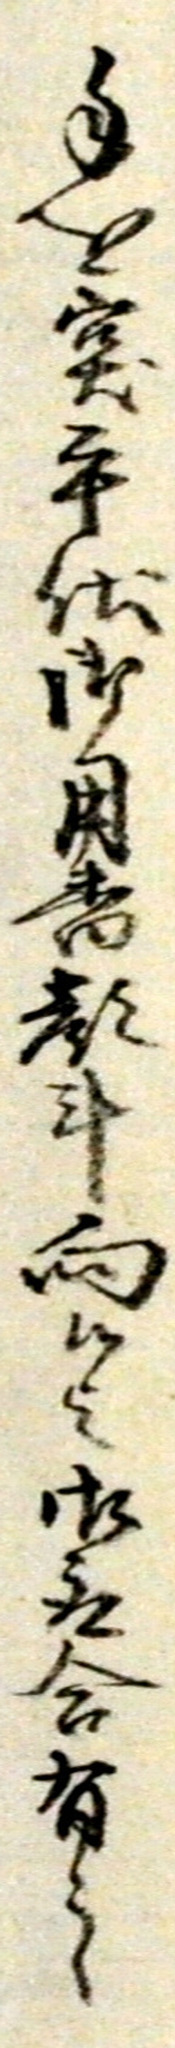手を突平伏御用番顔斗向候与御取合有之
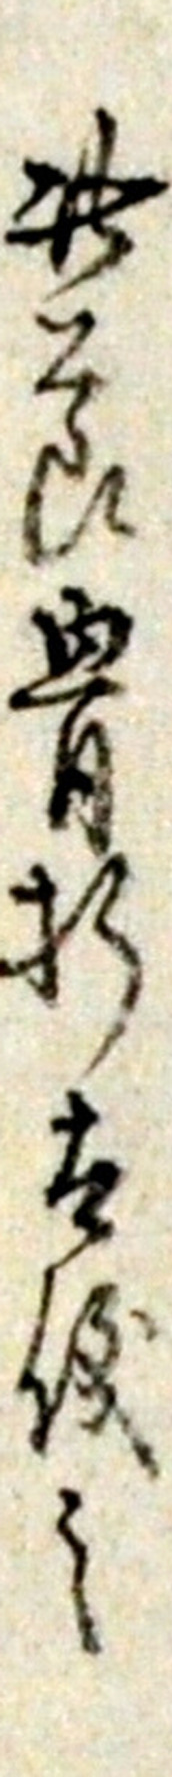此節骨折り太儀之
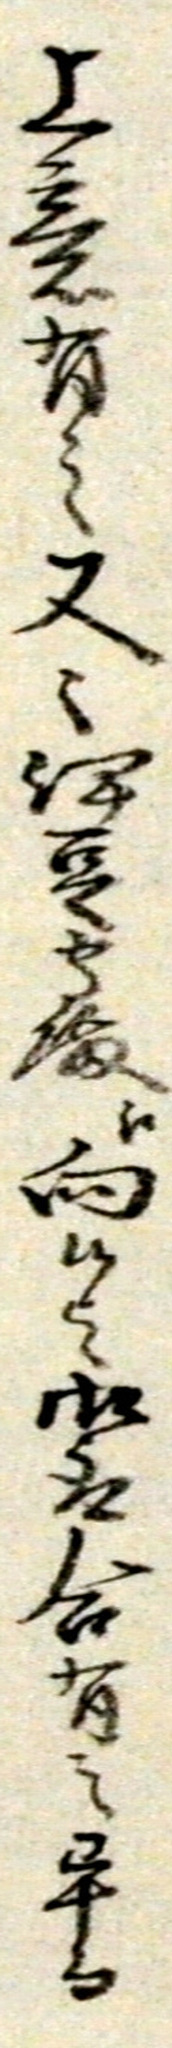上意有之又々伊豆守殿江向候与御取合有之畢而
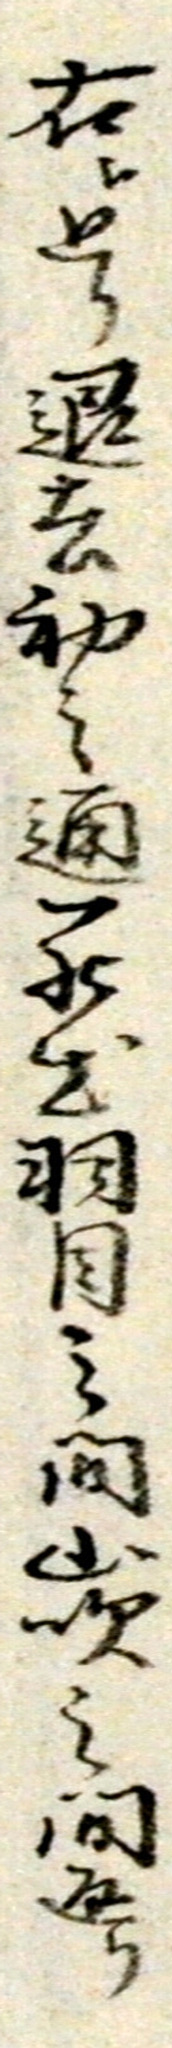右江廻り退去初之通罷出羽目之間山吹之間通り
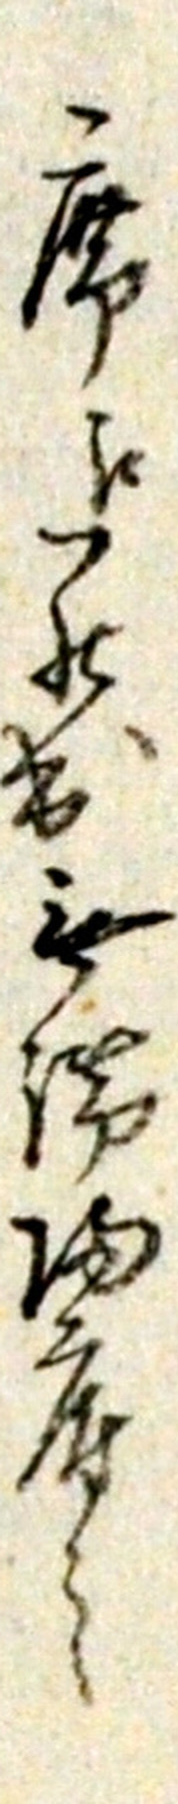席江罷出無滞帰府之
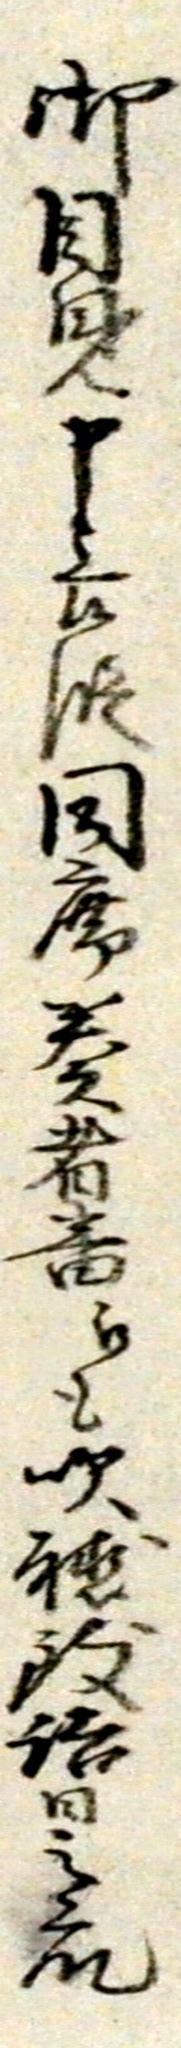御目見申上候段同席奏者番江も吹聴致詰日之衆
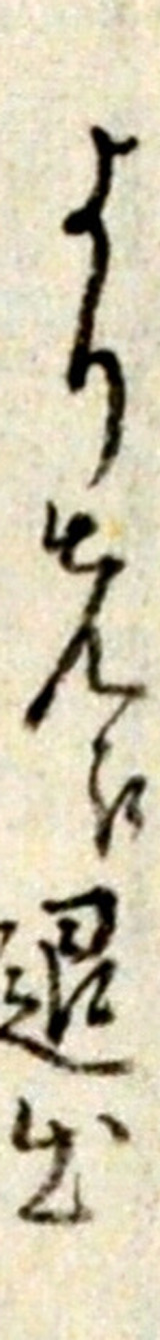より先江退出
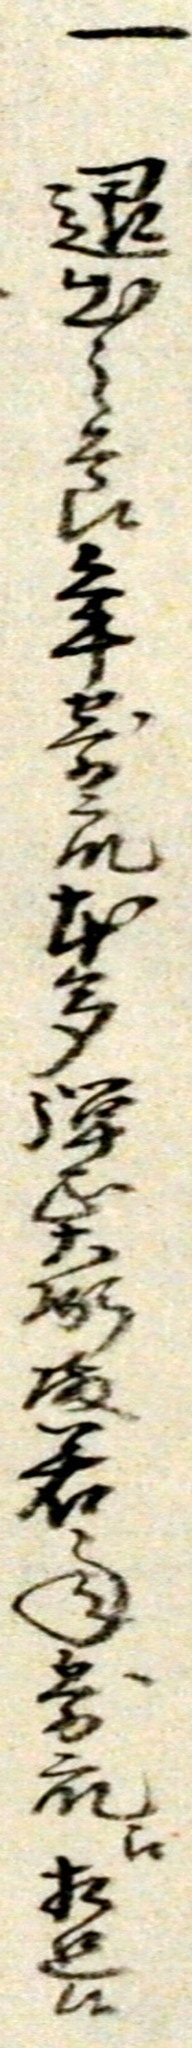一退出之節年寄衆本多弾正大弼殿若年寄衆江相廻候
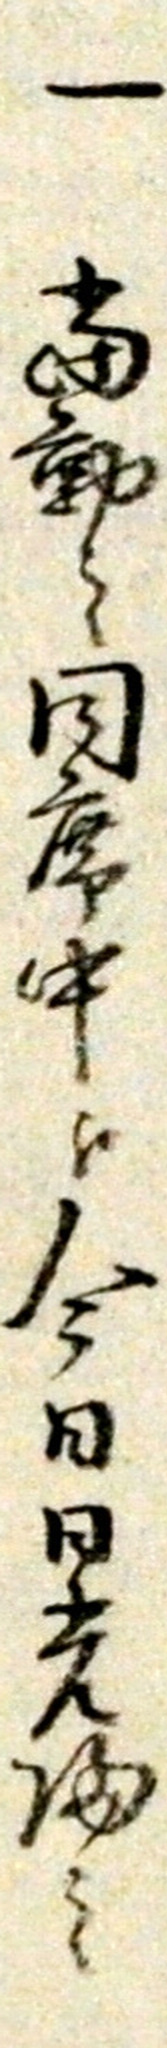一当勤之同席中江今日光帰之
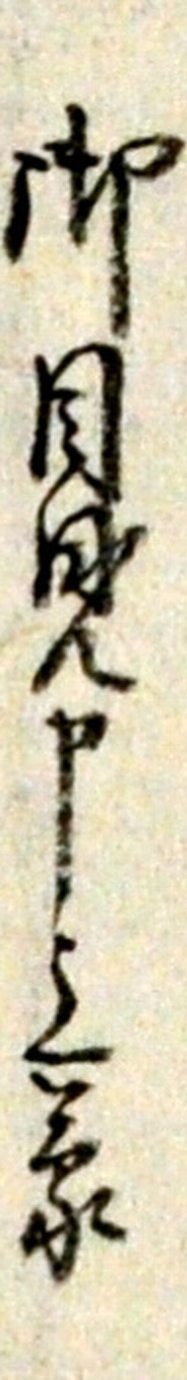御目見申上蒙
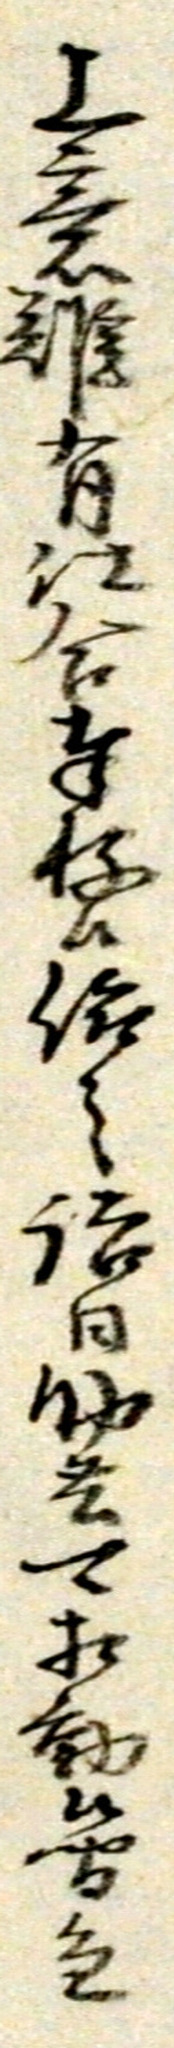上意難有仕合奉存候依之詰日助共可相勤候間色
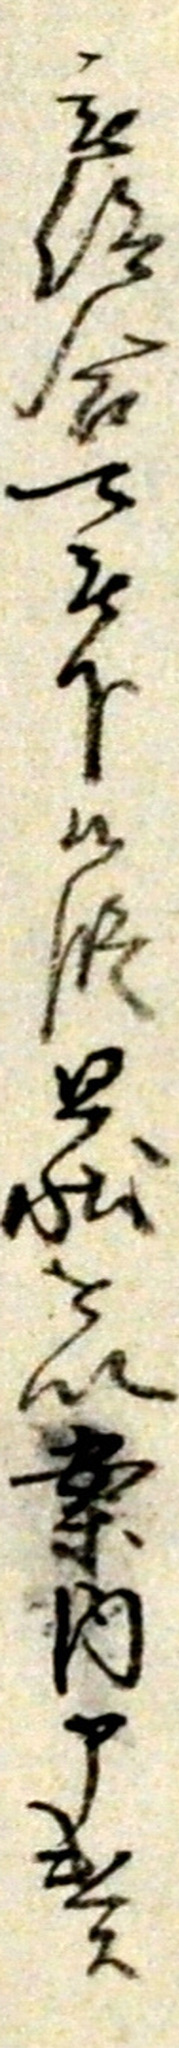被仰合可被下候段廻状を以案内申遣ス
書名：日光御名代相勤候節ノ留
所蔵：伊那市立高遠町図書館・合同会社AMANE
